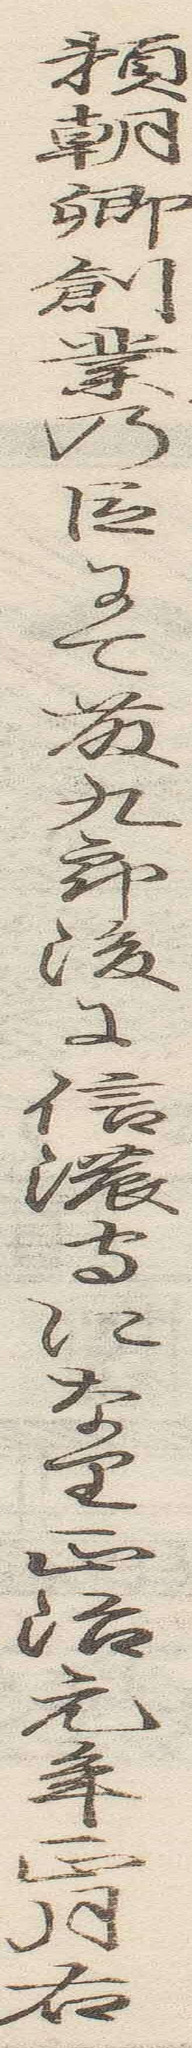賴朝卿創業の臣にて藤九郎後に信濃守になり正治元年正月右
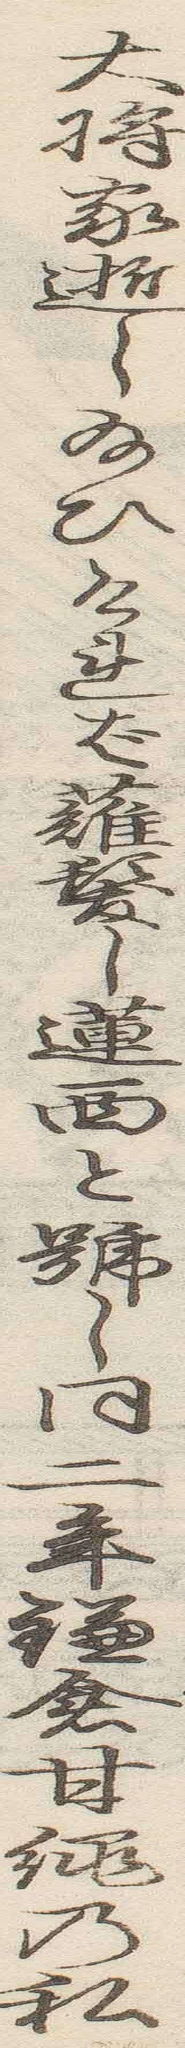大将家逝し給ひければ薙髪し蓮西と號し同二年鎌倉甘繩の私
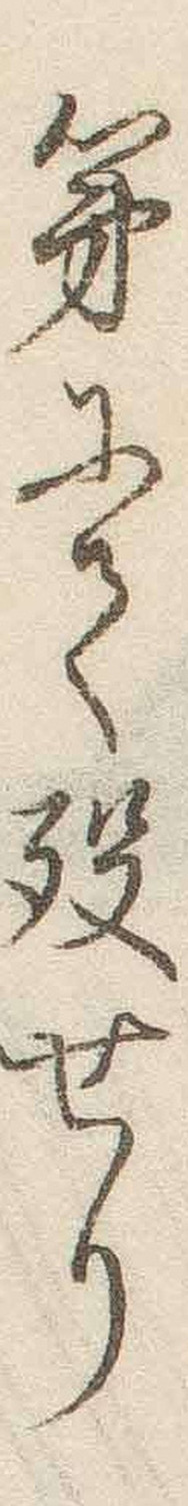第にて歿せり
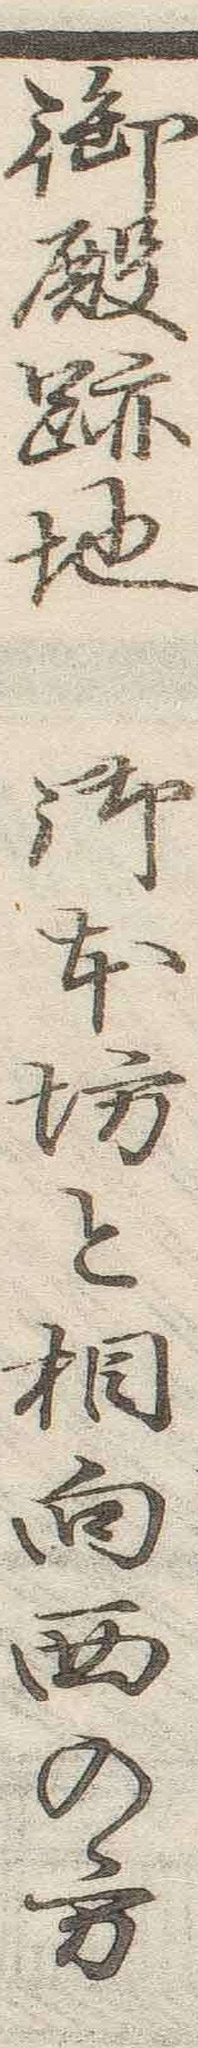御殿跡地御本坊と相向西の方
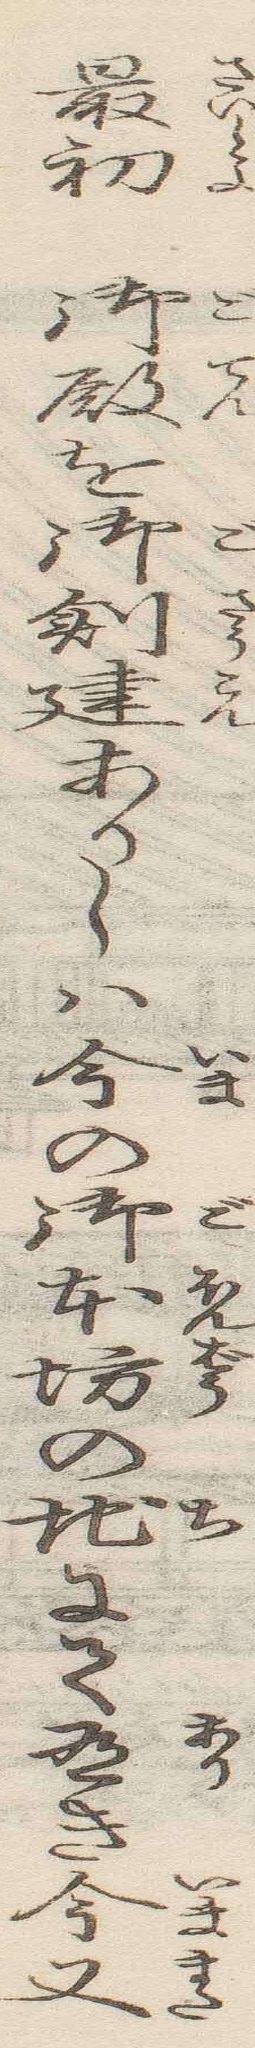最初御殿と御創建ありしは今の御本坊の地にて有き今又
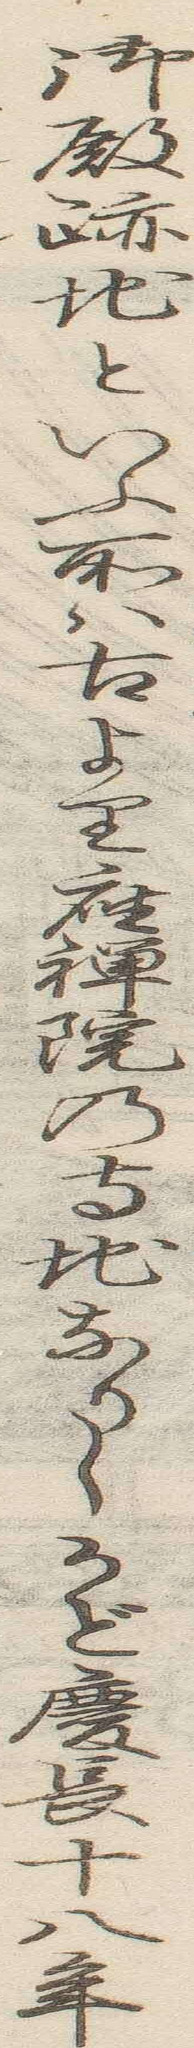御殿跡地といふ所は古より座禅院の寺地なりしかど慶長十八年
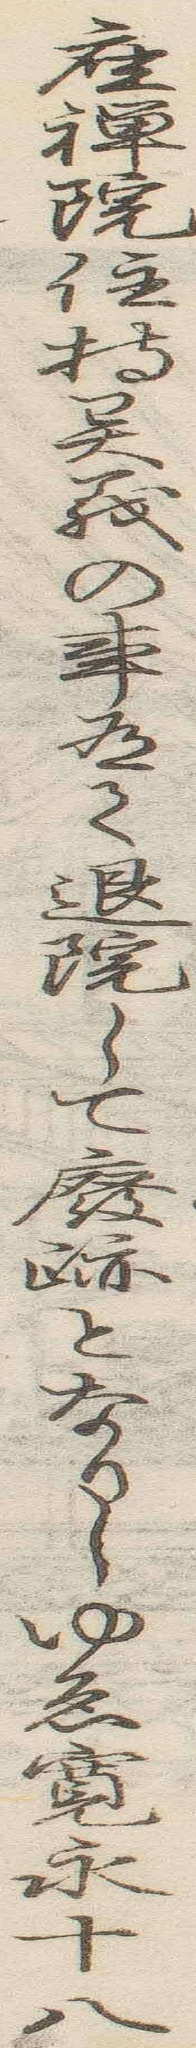座禅院住持異義の事有て退院して廢跡となりしゆゑ寛永十八
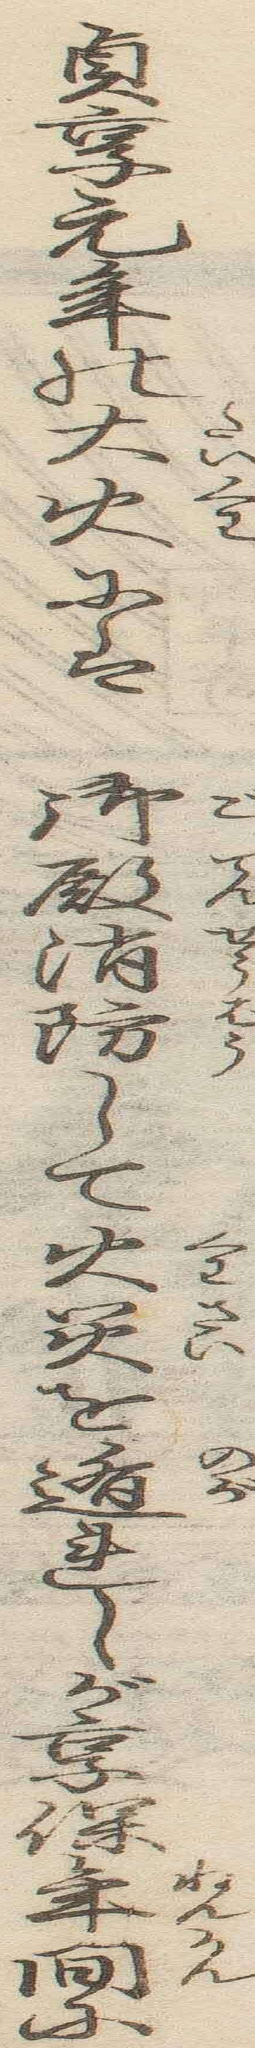貞享元年の大火には御殿消防して火災を遁れしが享保年間に

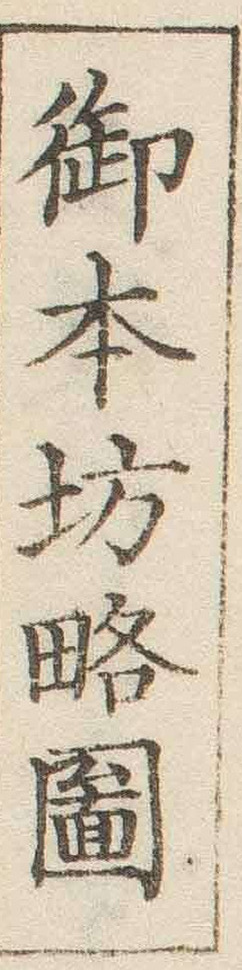御本坊略圖

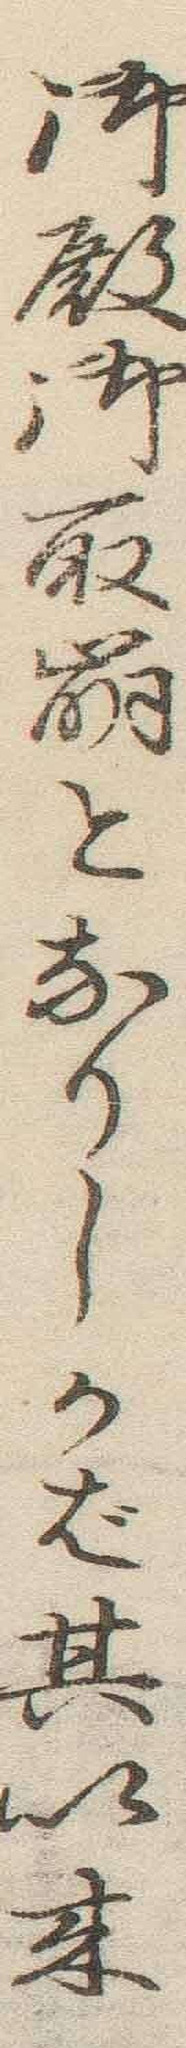御殿御取崩となりしかば其以来
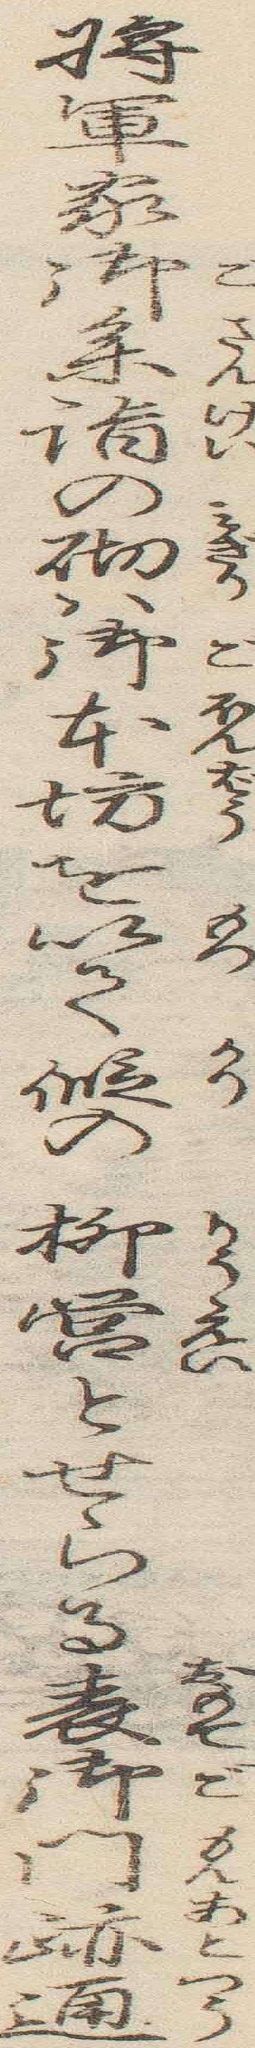將軍家御参詣の砌は御本坊を以て假の柳営とせらる表御門跡通
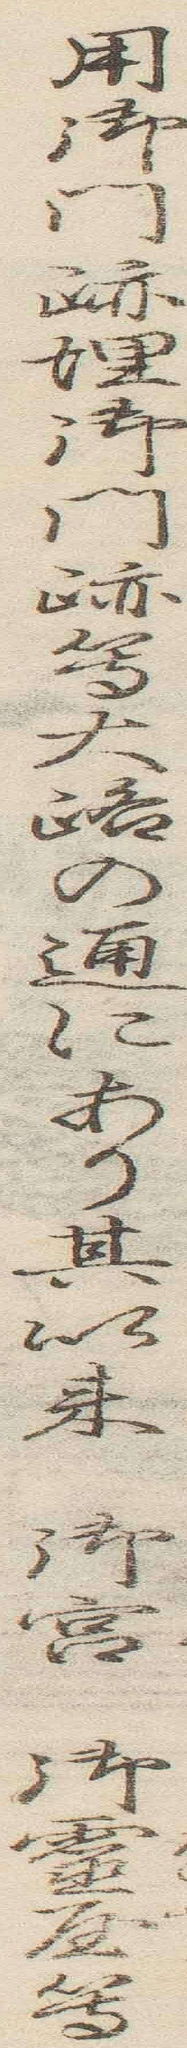用御門跡埋御門跡等大路の通にあり其以来御宮御靈屋等
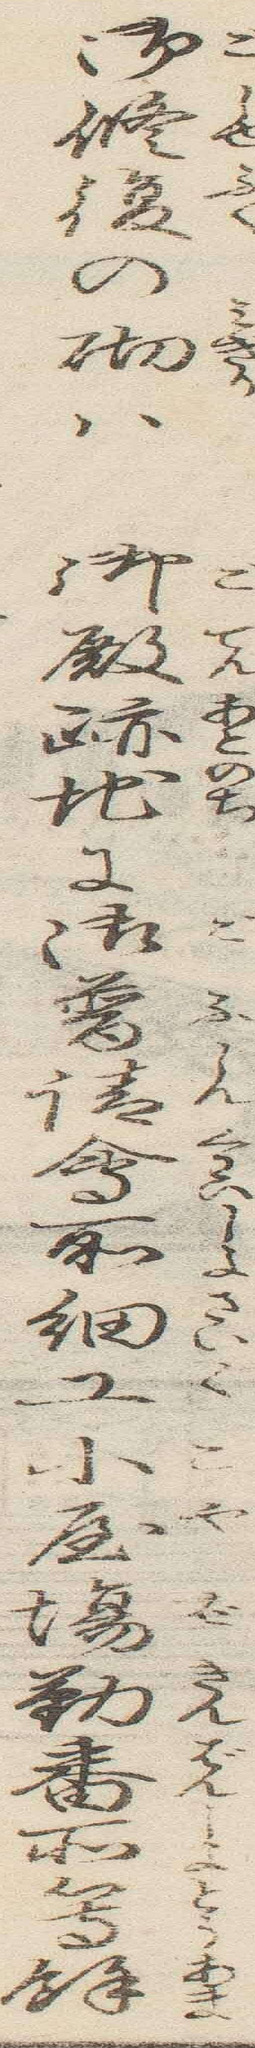御修復の砌は御殿跡地に御普請會所細工小屋塲勤番所等餘
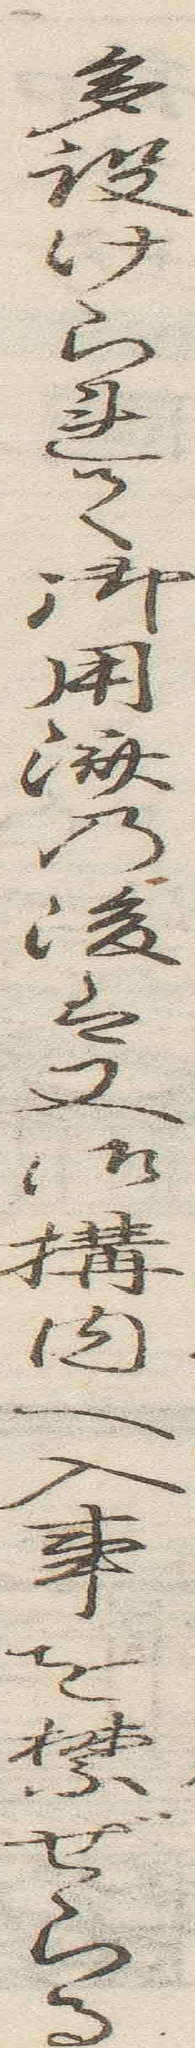多設けられて御用濟の後は又御構内へ入事を禁ぜらる
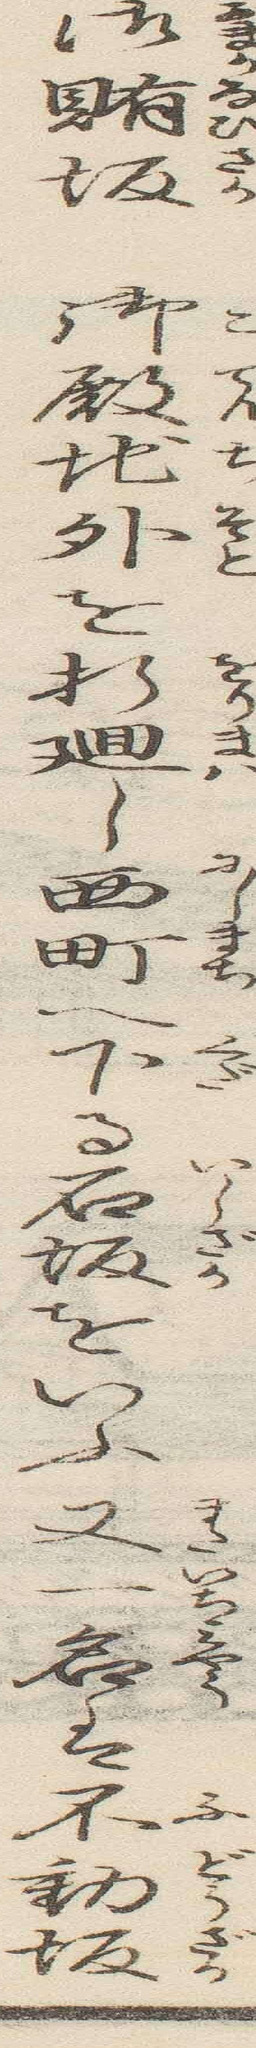御賄坂御殿地外を折廽し西町へ下る石坂をいふ又一名は不動坂
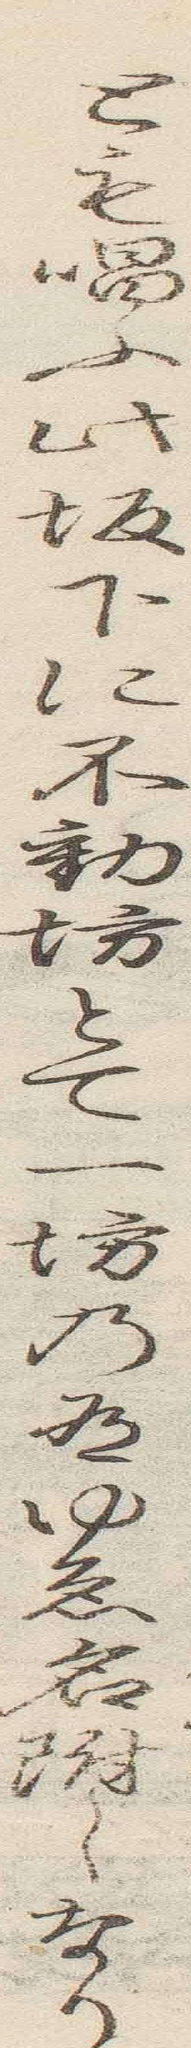とも唱ふ此坂下に不動坊とて一坊の有ゆゑ名附しなり
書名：日光山志
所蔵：東京学芸大学附属図書館 国文学研究資料館
